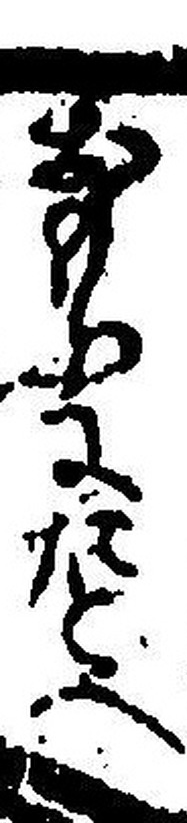おもふにたとへ
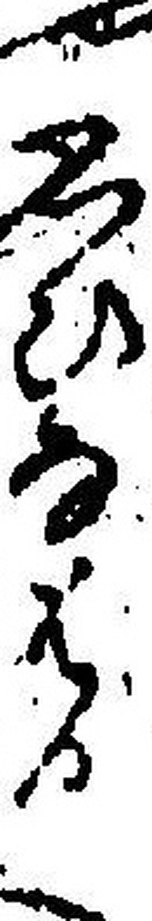思ひははる
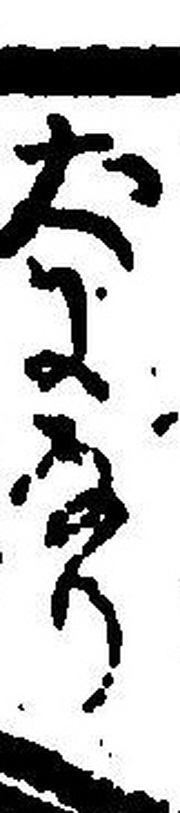犬になり
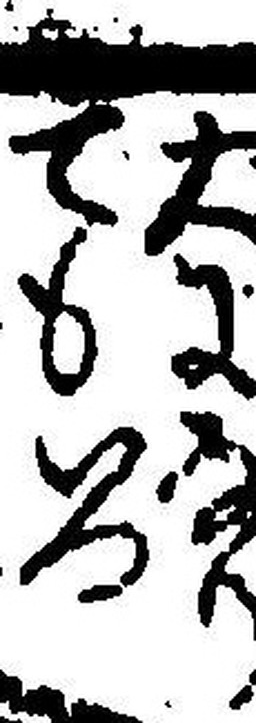てもいつ
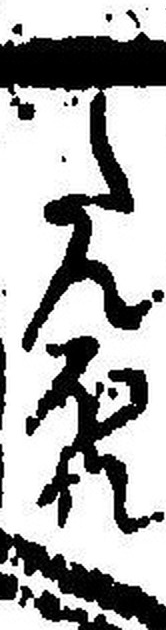たんほれ
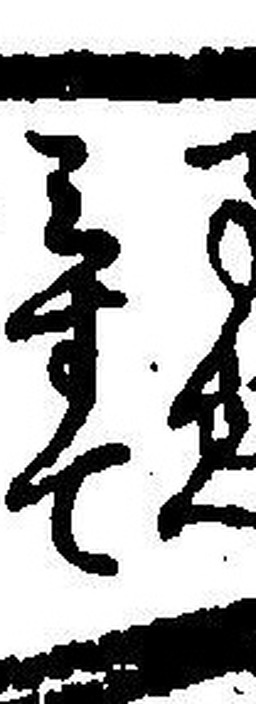みすて
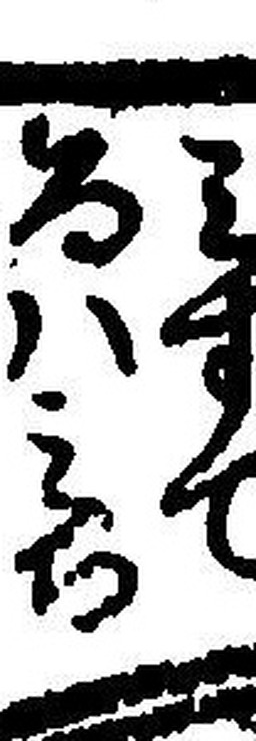るはみち
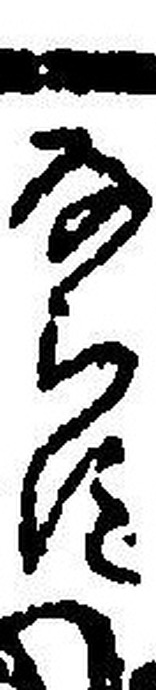ならす
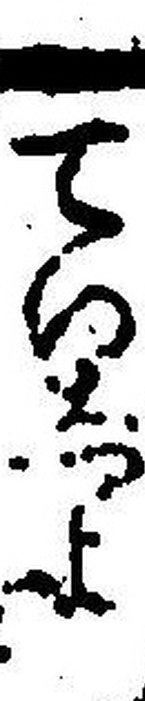ていじよ
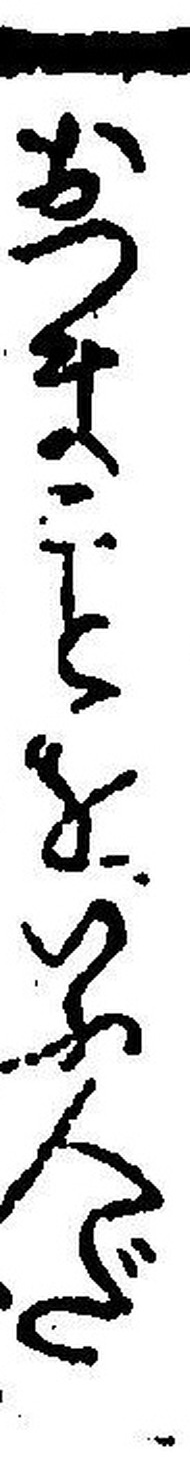おつまことをいふ人だ
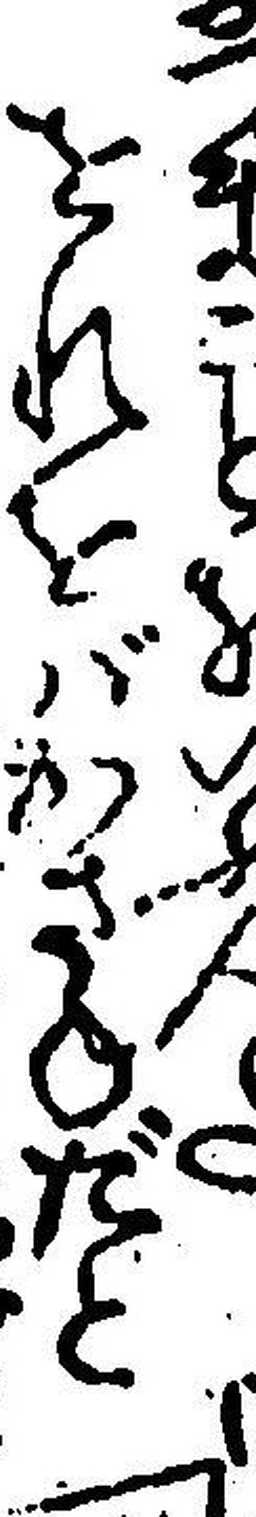をれをばかさねだと
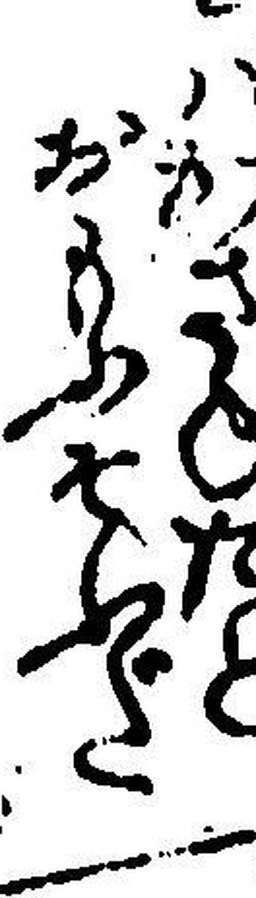おもふそふだ

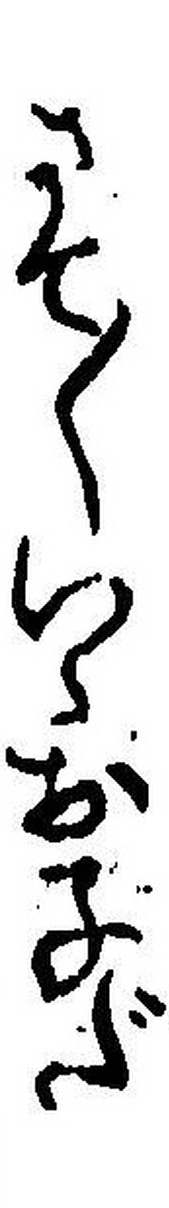さて〳〵いゝお子だ
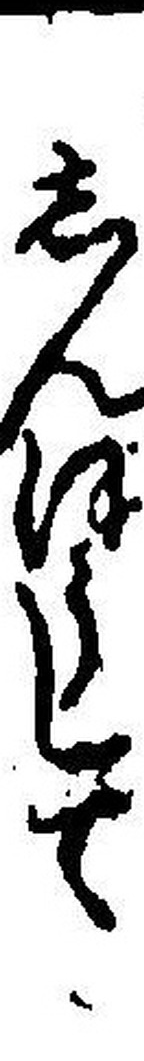しんぼうして
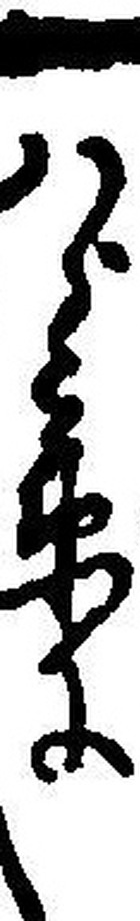八郎兵衛に
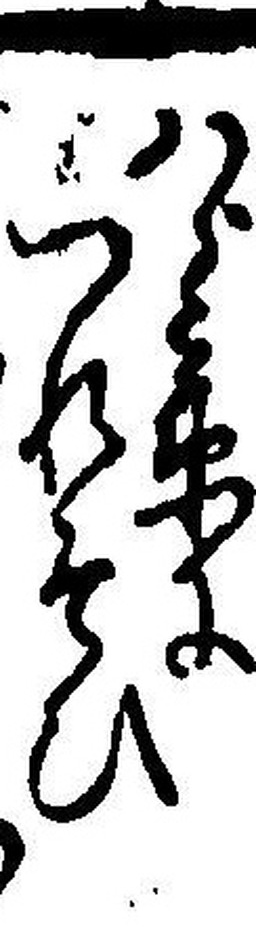つれそひ
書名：花芳野犬斑 / 山東京伝作
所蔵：東京大学総合図書館 General Library in the University of Tokyo, JAPAN
